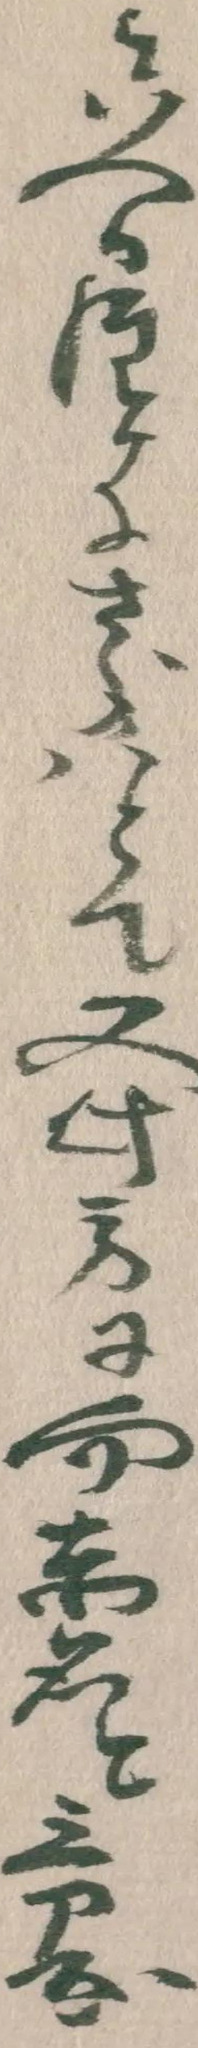といへるほとにさらはとて又此方に向赤名と三刀屋
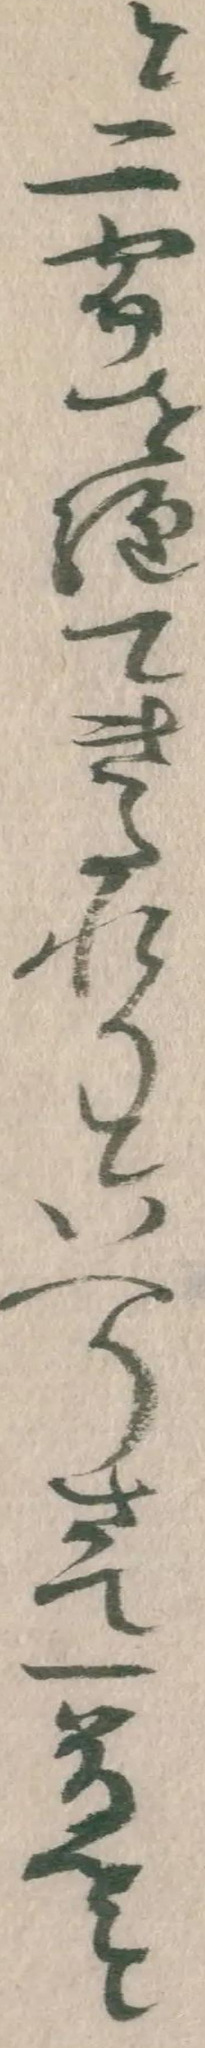と二宿を経てきたれりといへりさて一首をと
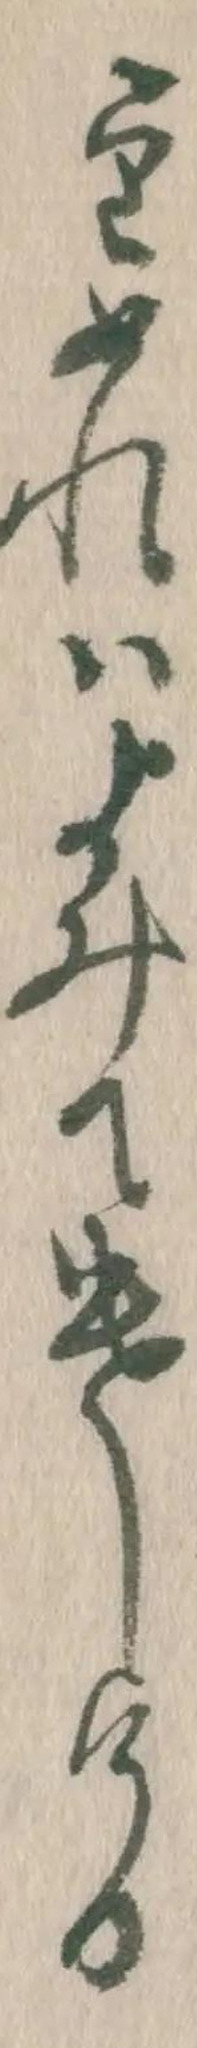望めれはよみて遣しける

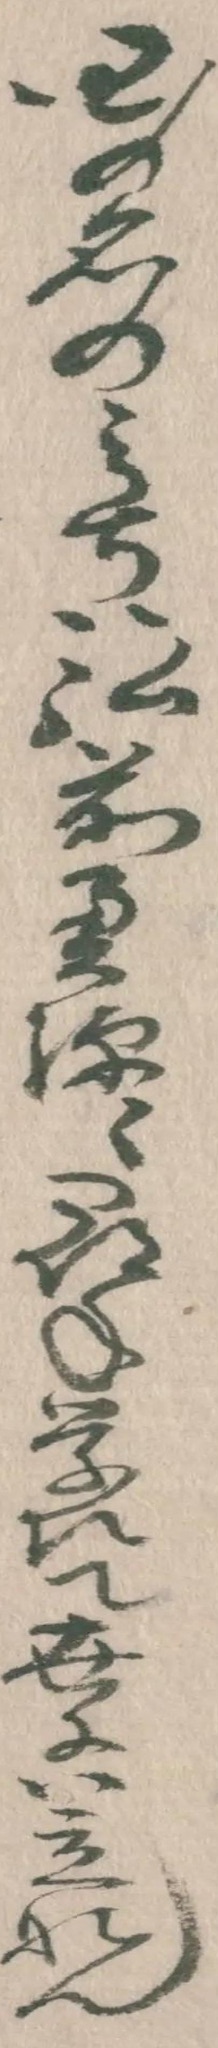国の名のみちは弘前奥深く尋ね学ひて世には立なん
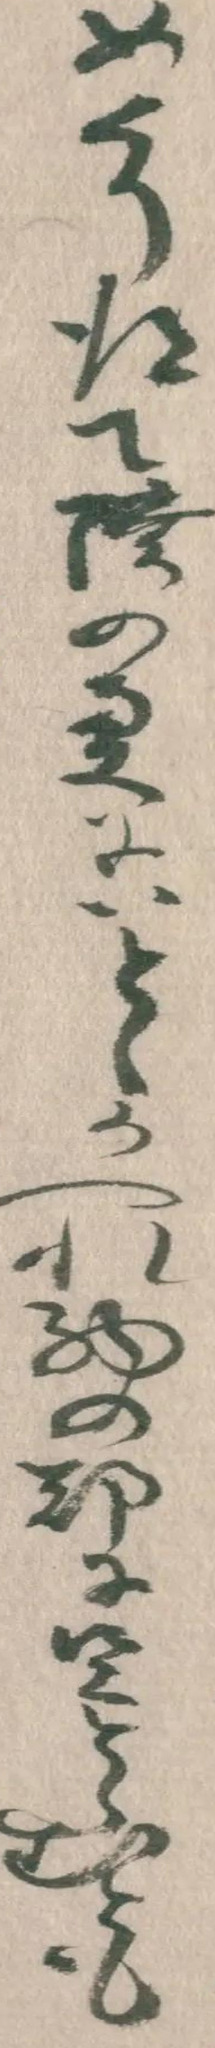めくり得て陸の奥にはとくかへれ西の都に足とゝむとも
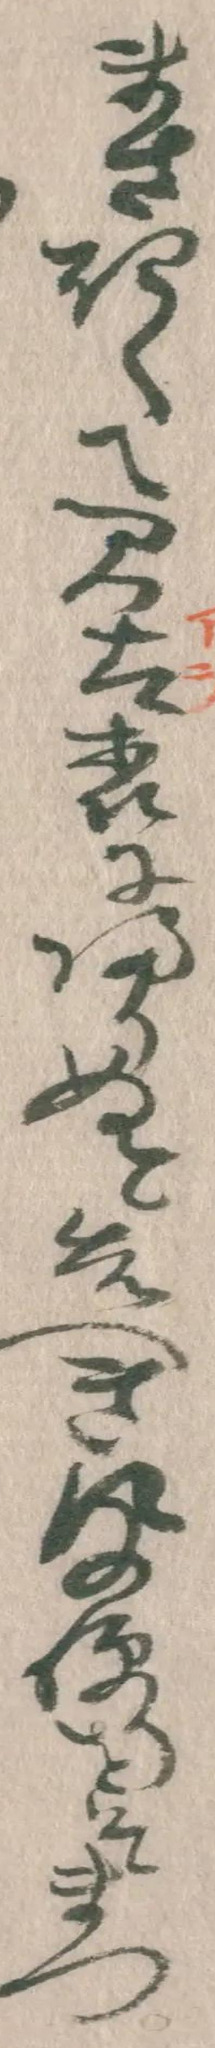まさきくて見青森に帰りぬと出るへき風の便りをそまつ
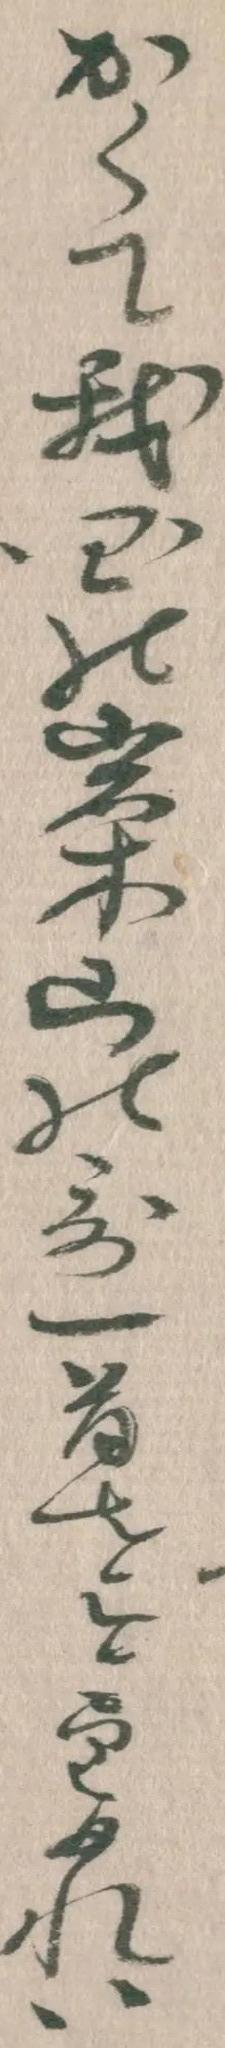かくて我国の岩木山の哥一首を今望たれは
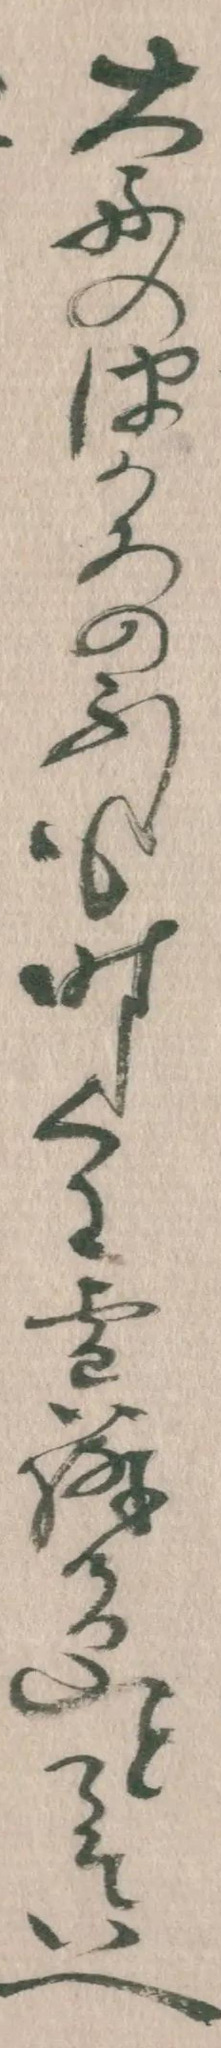大舟の津かろのふしも時しくに雪は降けり山とこそいへ
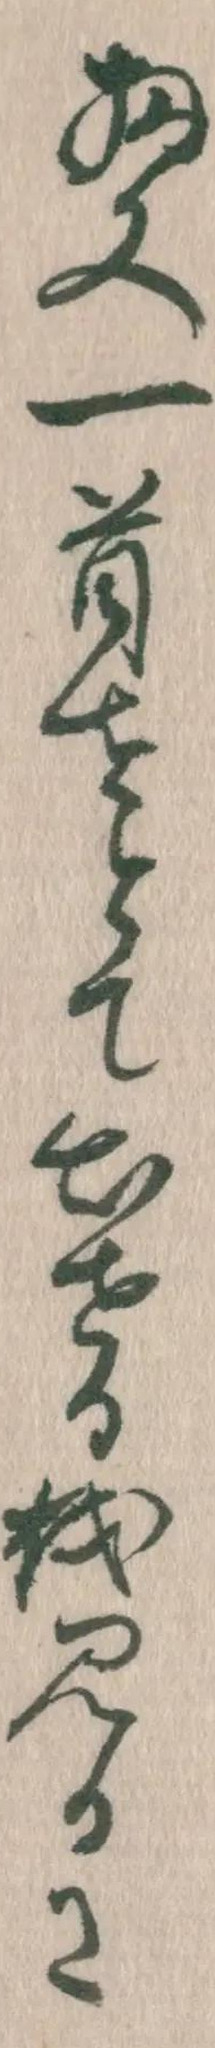扨又一首をとて出せるを見るに
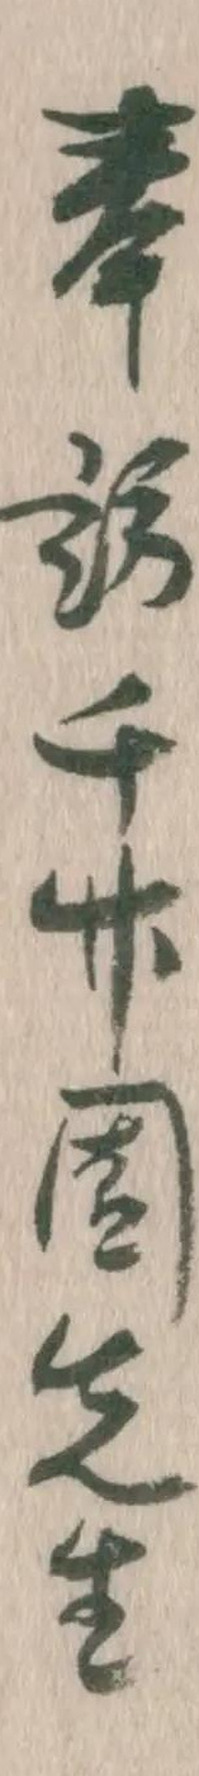奉訪千竹園先生
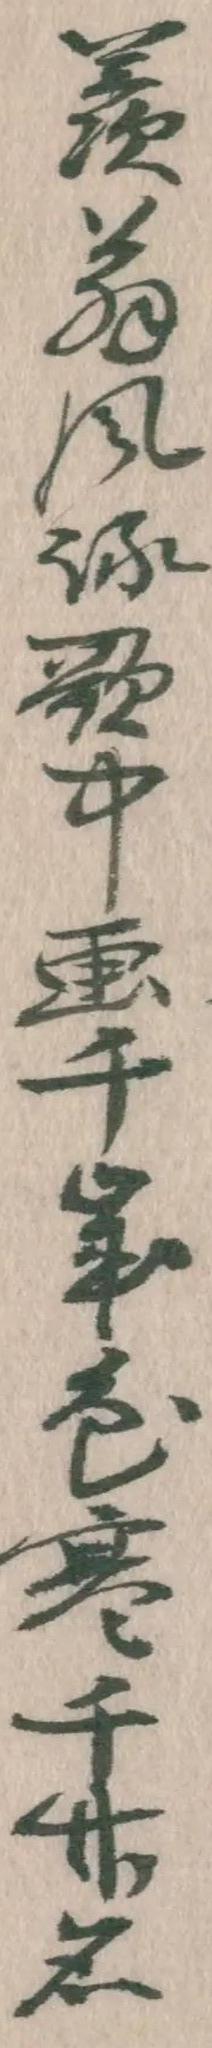羨翁風詠歌中画千歳色塞千竹名
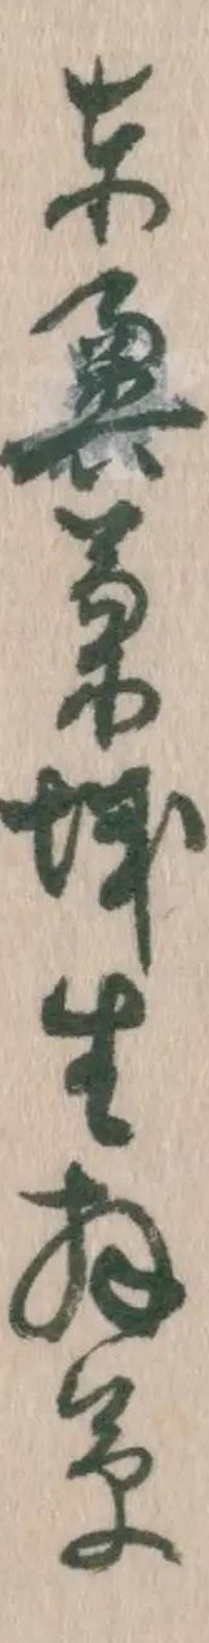東奥菊城生拝草
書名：出雲紀行. 20
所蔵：国立国会図書館 National Diet Library, JAPAN
